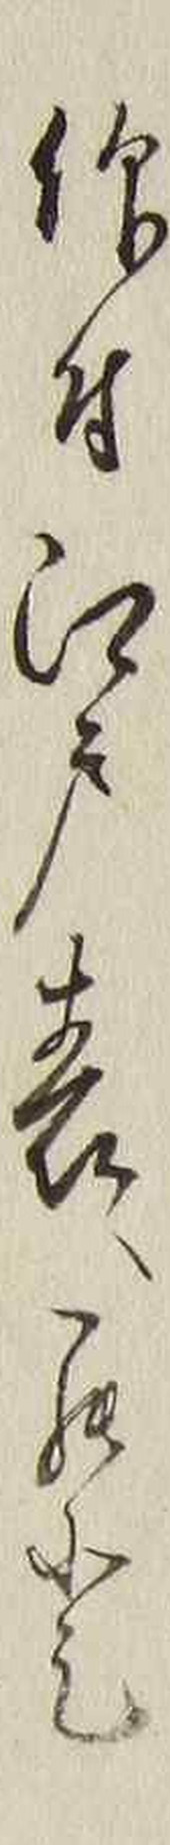仰付江戸表へ罷登
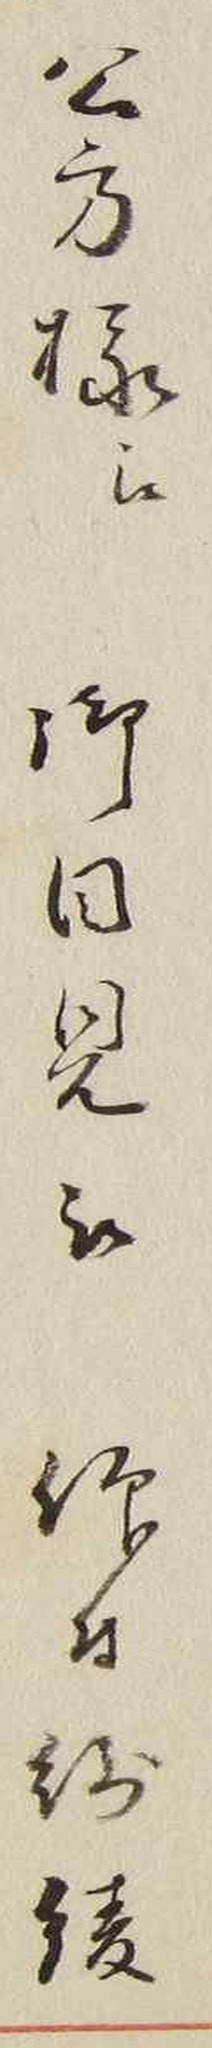公方様江御目見被仰付紗綾

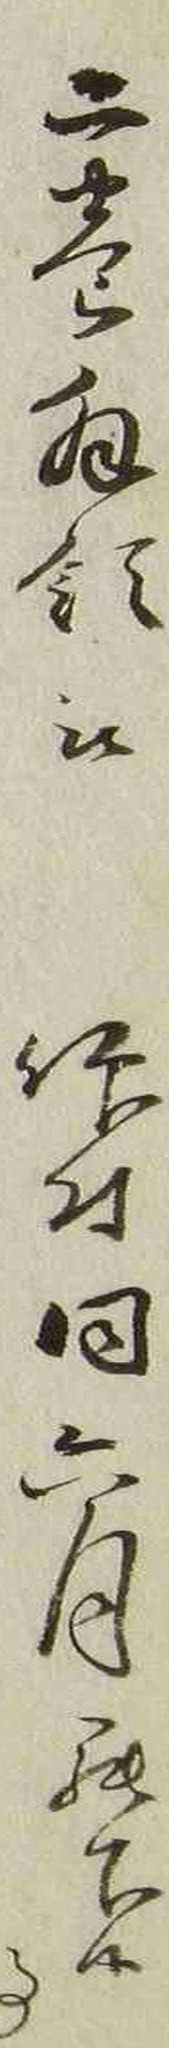二巻拝領被仰付同六月罷下候事
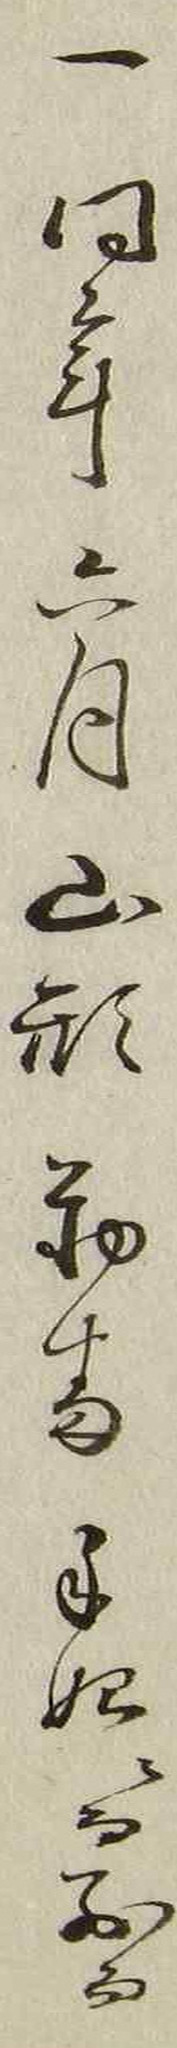一同年六月山形勤番手配に而別而
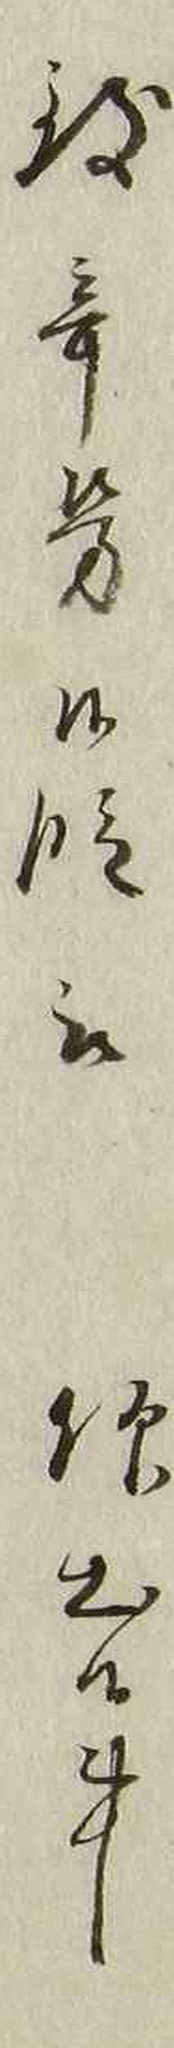致辛労候段被仰出候事
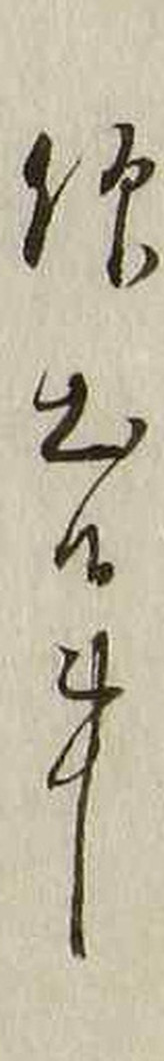仰出候事
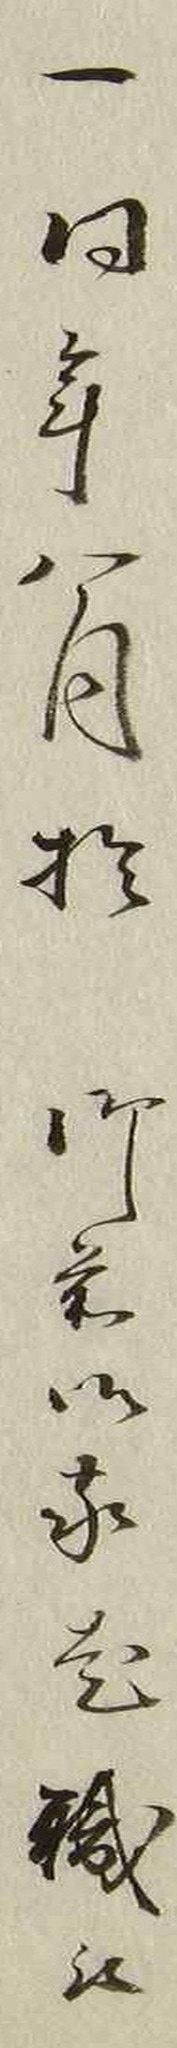一同年ハ月於御前御家老職被
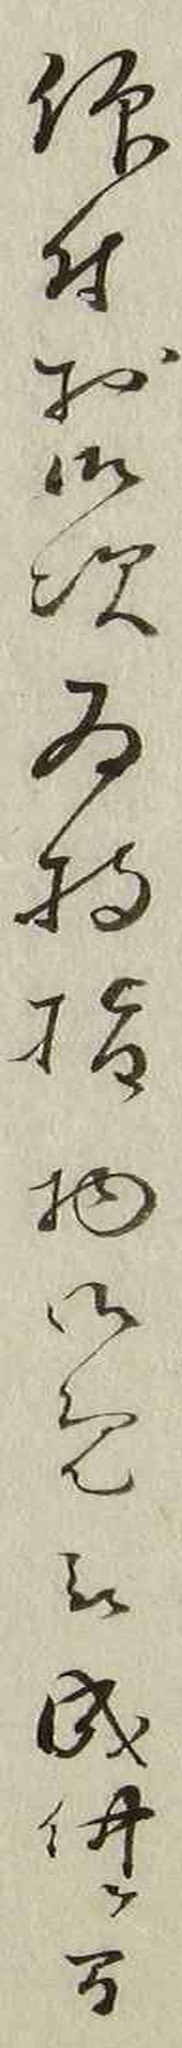仰付於御次為持指物御免被成仲ヶ間
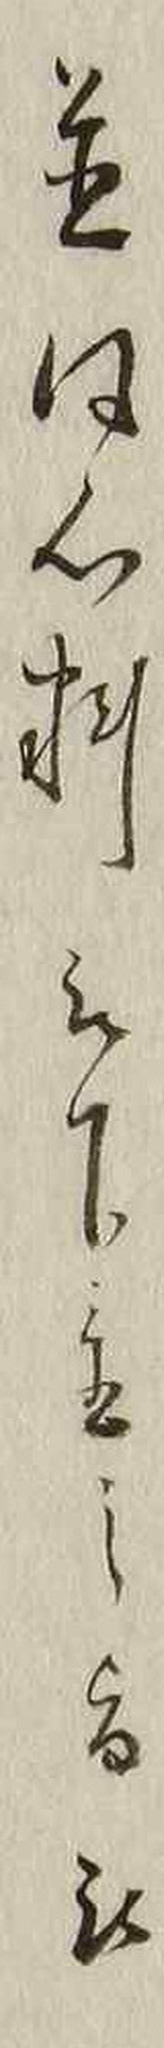並同心料被下置之旨被
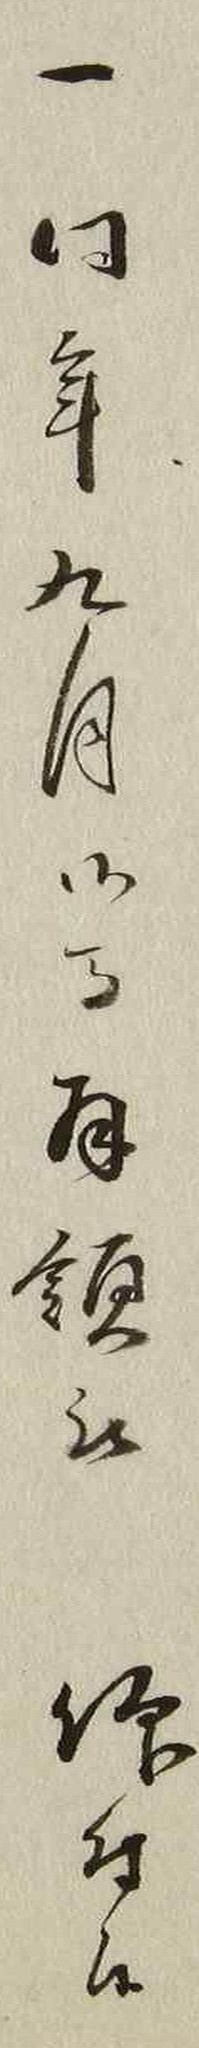一同年九月御馬拝領被候仰付候
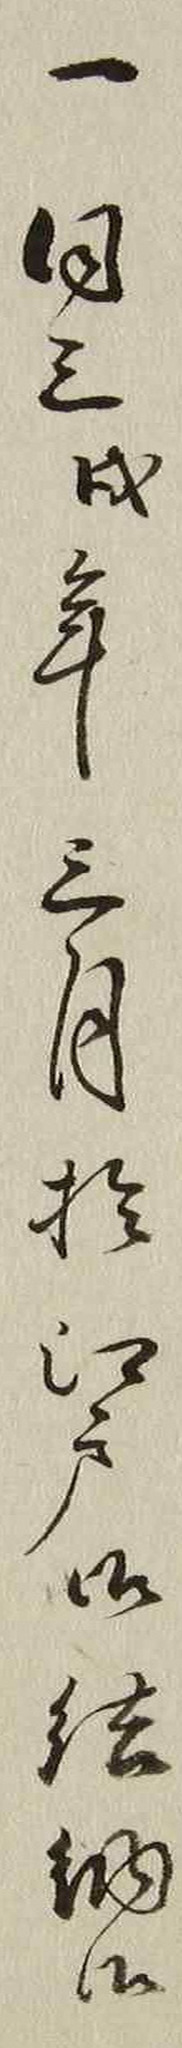一同三戌年三月於江戸御結納御
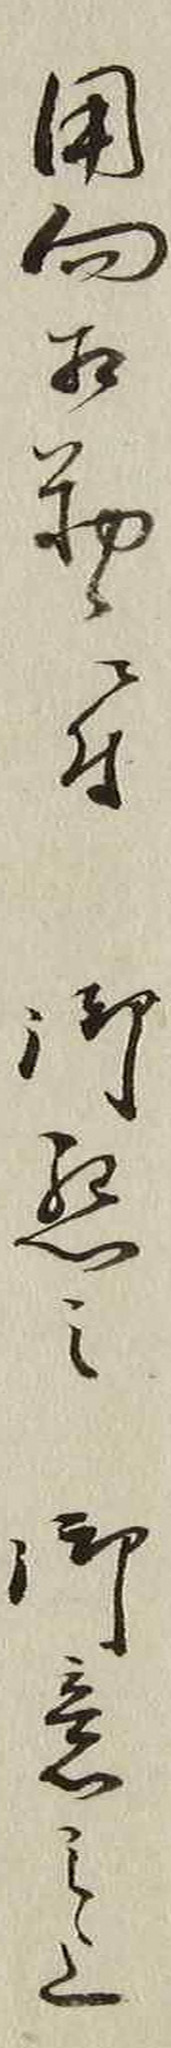用向相勤候に付御懇之御意之上
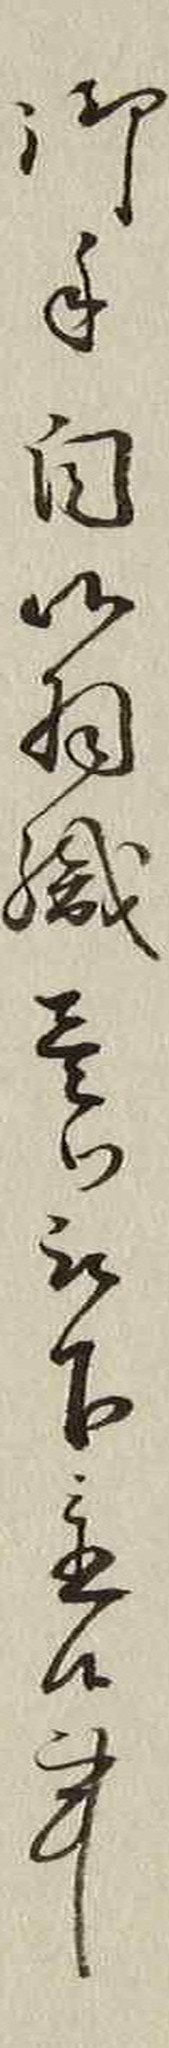御手自御羽織壱つ被下置候事
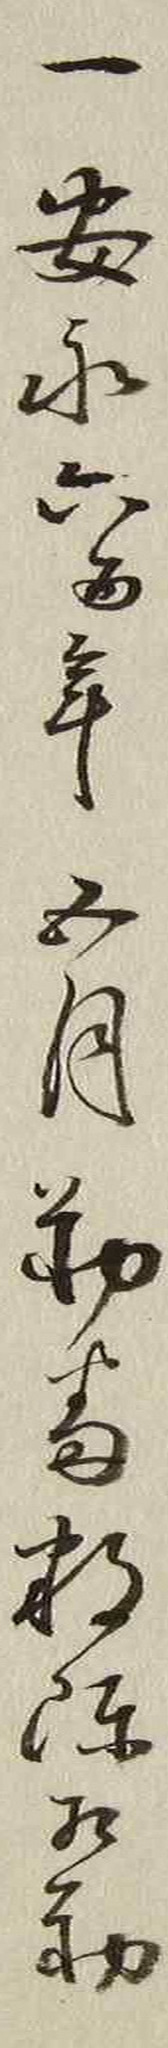一安永六酉年五月勤番数陣相勤
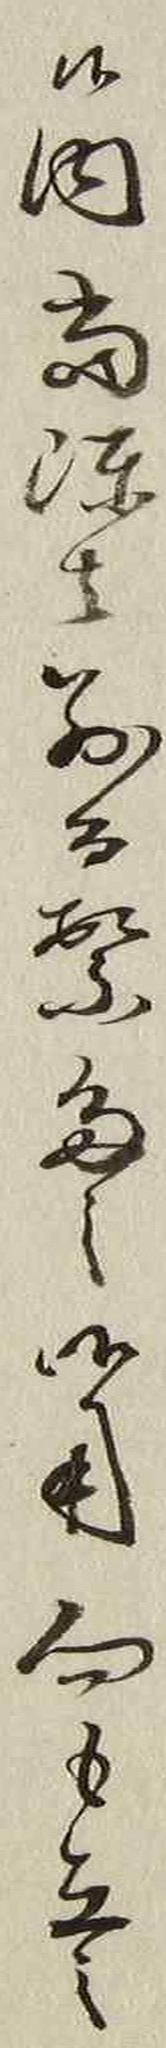候内当陣は別而繁多之御用向も在之
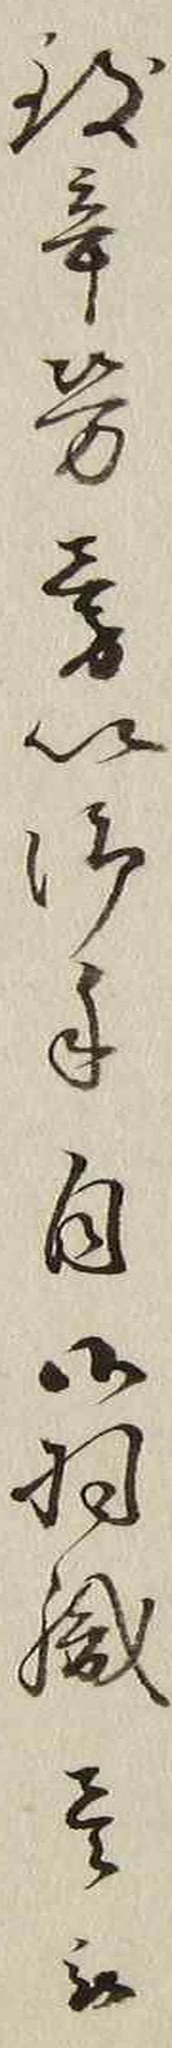致辛労旁以御手自御羽織壱被
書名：諸士系譜　巻之159　な之部1
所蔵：会津若松市立会津図書館
